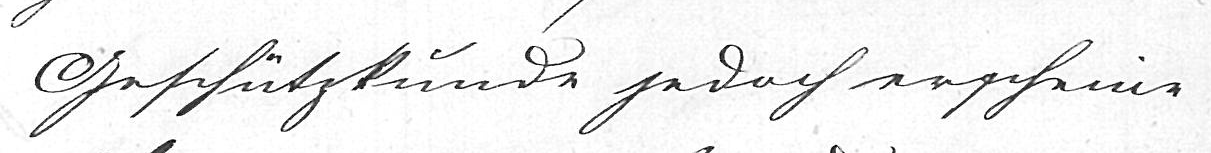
Geschützkunde jedoch erscheine
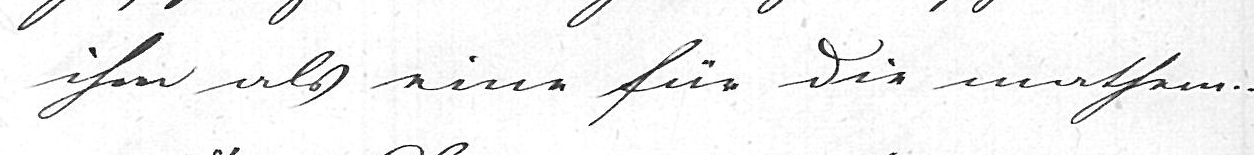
ihm als eine für die mathem.-
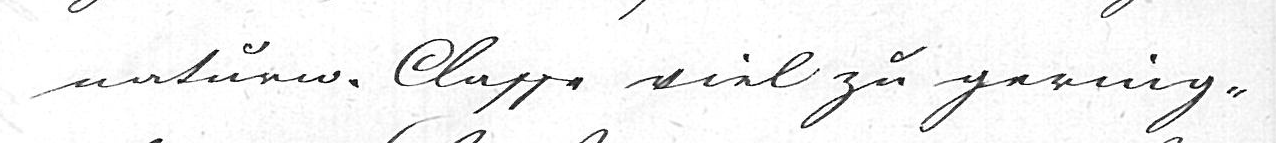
naturw. Classe viel zu gering-
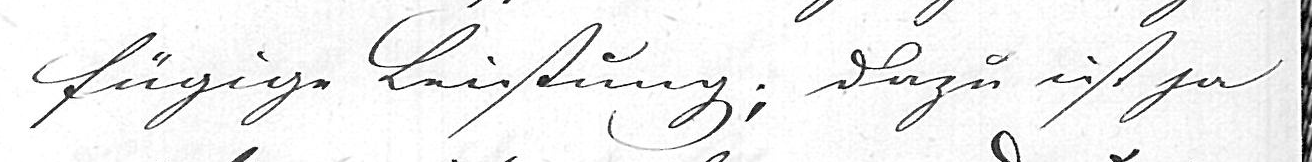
fügige Leistungen; dazu ist ja
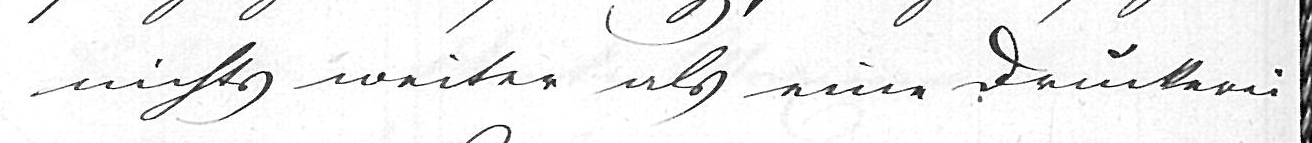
nichts weiter als eine Druckerei
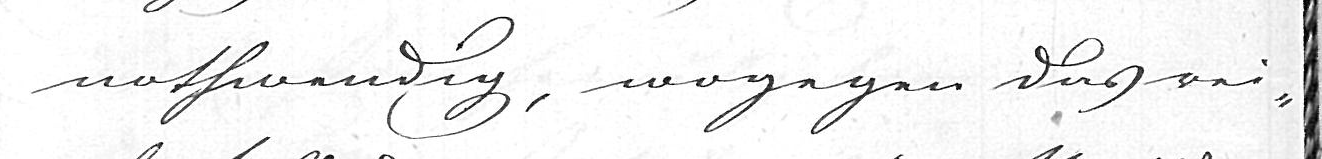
nothwendig, wogegen das rei-
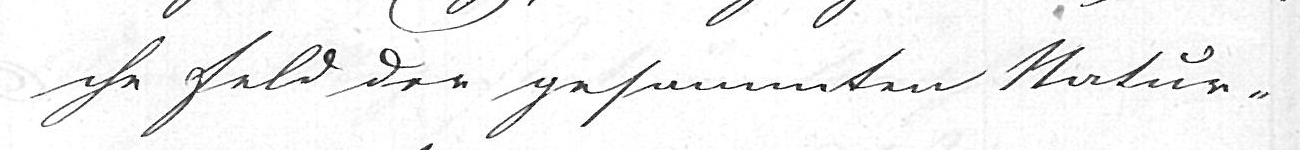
che Feld der gesammte Natur-
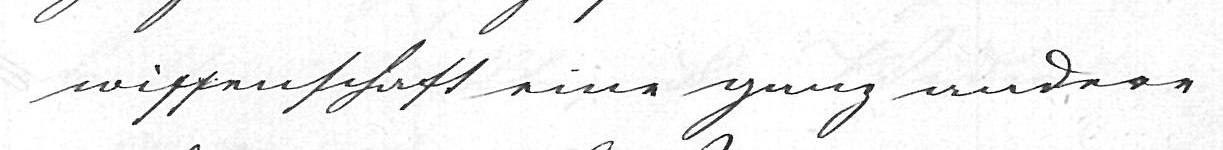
wissenschaft eine ganz andere
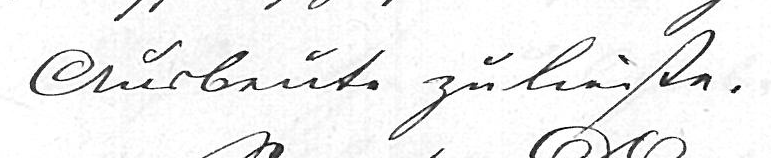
Ausbeute zuließe.
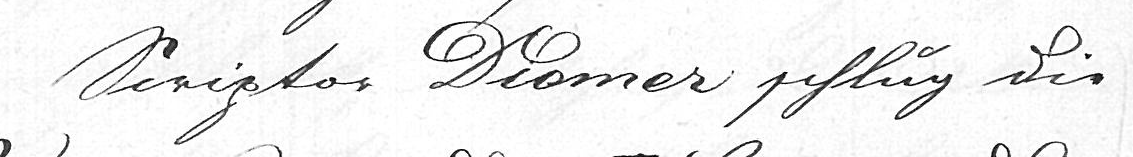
Scriptor Diemer schlug die
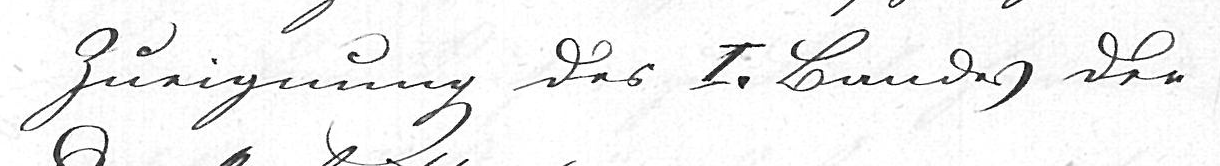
Zueignung des I. Bandes der
